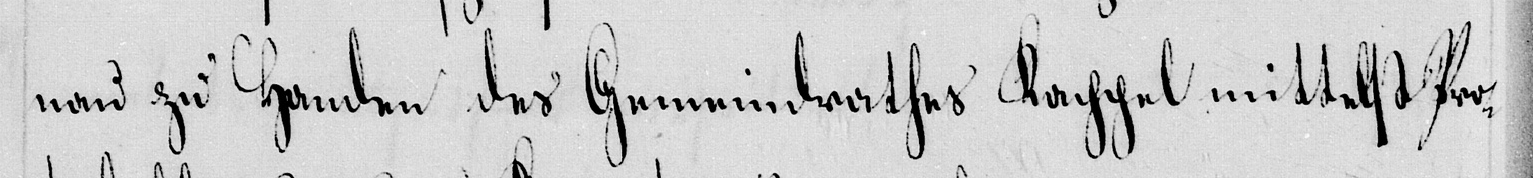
nau zu Handen des Gemeindrathes Kappel mittelst Pro¬
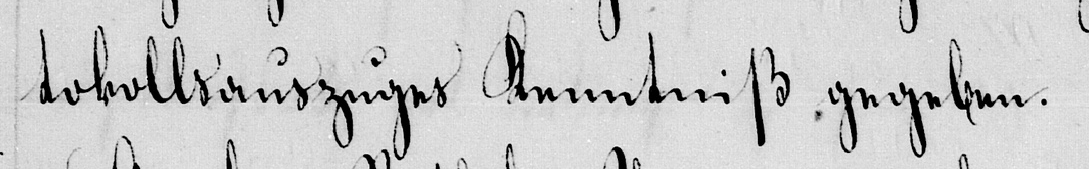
tokollsauszuges Kenntniß gegeben.
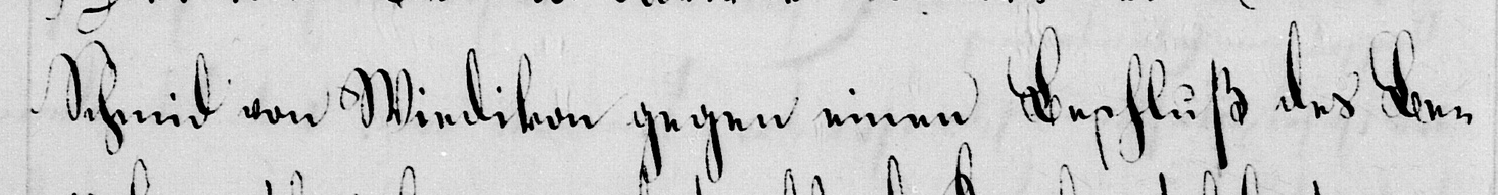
Schmid in Wiedikon gegen einen Beschluß des Be¬
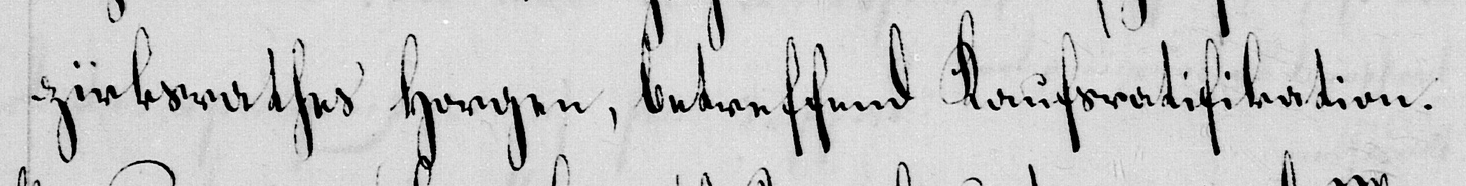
zirksrathes Horgen, betreffend Kaufsratifikation.
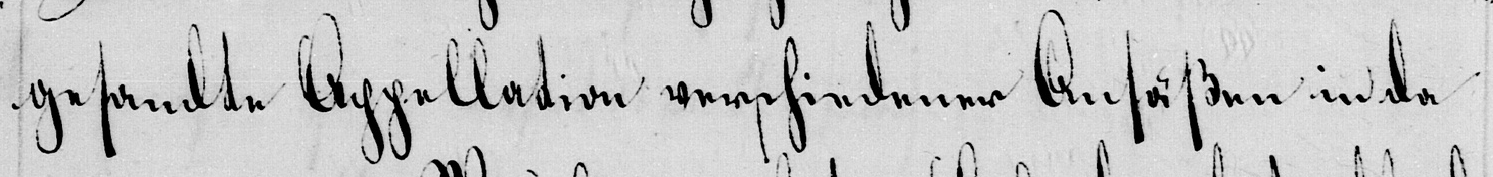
gesandte Appellation verschiedener Ansäßen in da
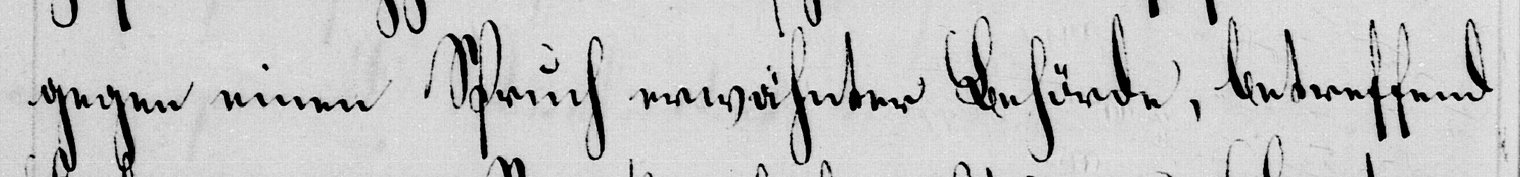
gegen einen Spruch erwähnter Behörde, betreffend
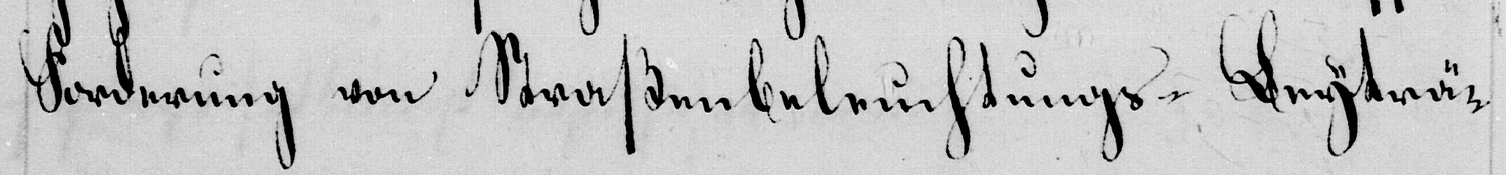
Forderung von Straßenbeleuchtungs-Beyträ¬
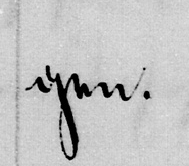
gen.
